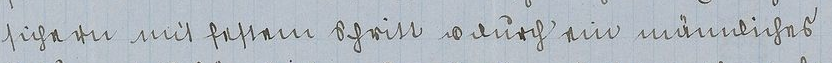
sichern mit festem Schritt & durch ein mündliches
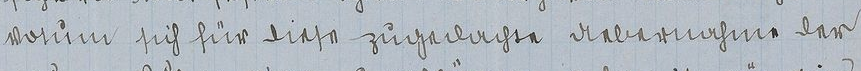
Votum sich für diese zugedachte Uebernahme der
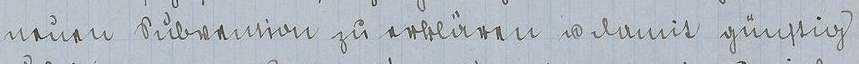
neuen Subvention zu erklären & damit günstig
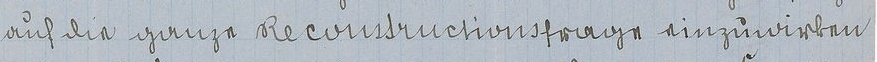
auf die ganze Reconstructionsfrage einzuwirken
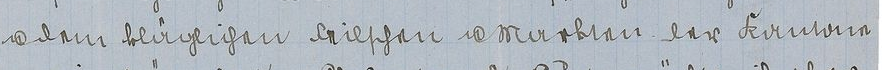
& dem kläglichen Feilschen & Maeklen der Kantone
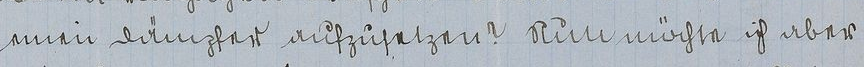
einen Dämpfer aufzusetzen? Nun möchte ich aber
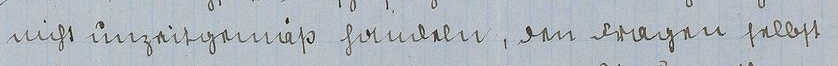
nicht unzeitgemäß handeln, den Fragen selbst
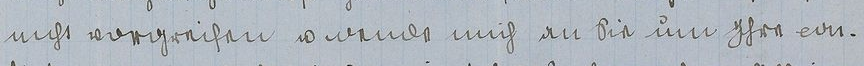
nicht vorgreifen & wende mich an Sie um Ihre con-
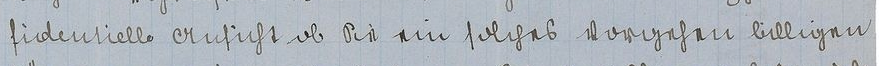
fidentielle Ansicht ob Sie ein solches Vorgehen billigen
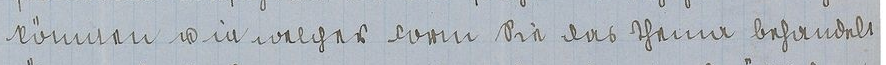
könnten & in welcher Form Sie das Thema behandelt
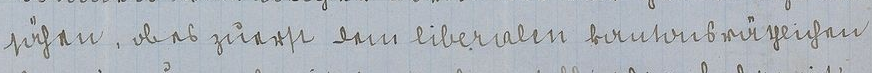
sähen, ob es zuerst dem liberalen kantonsräthlichen
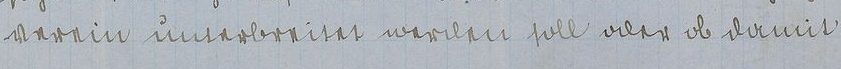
Verein unterbreitet werden soll oder ob damit
